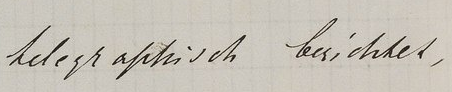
telegraphisch berichtet,
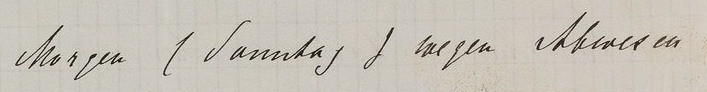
morgen (Sonntag) wegen Abwesen-
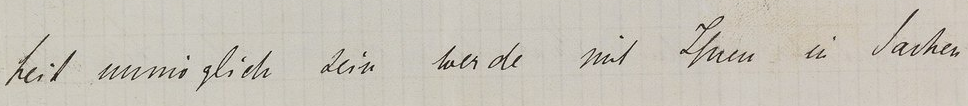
heit unmöglich sein werde mit Ihnen in Sachen
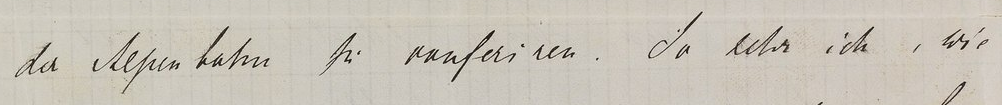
der Alpenbahn zu conferiren. So sehr ich, wie
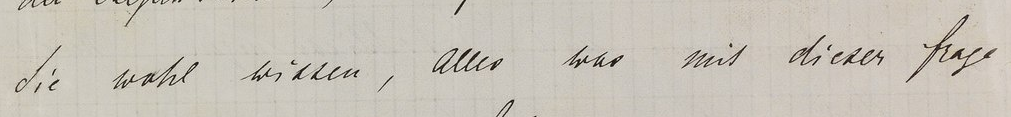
Sie wohl wissen, alles was mit dieser Frage
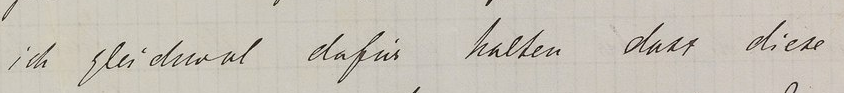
ich gleichwol dafür halten dass diese
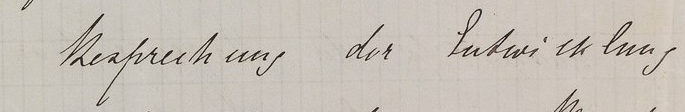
Besprechung der Entwicklung
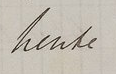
treten
